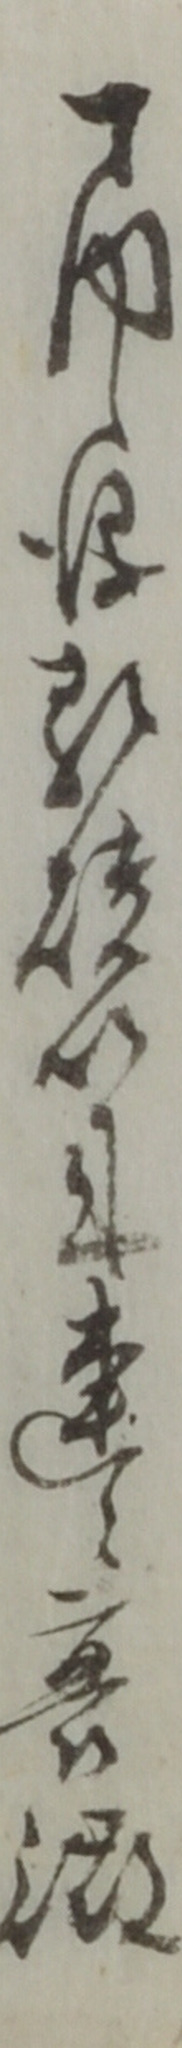丁内候儀類以来連々衰微
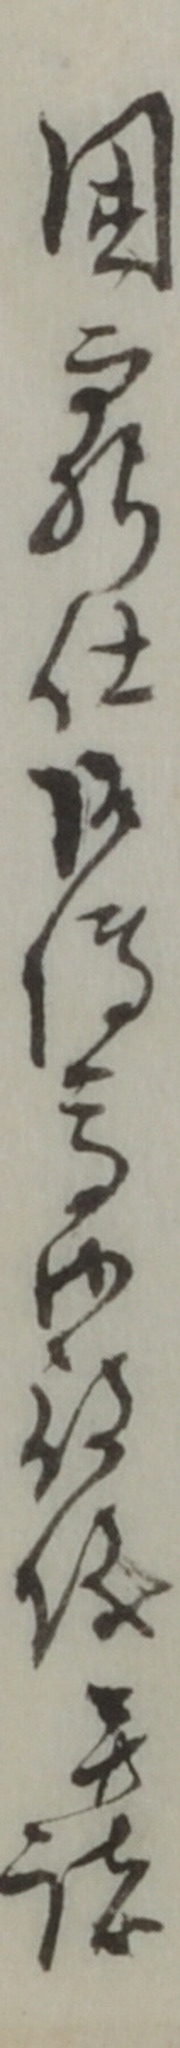困窮仕御伝馬御役儀并諸
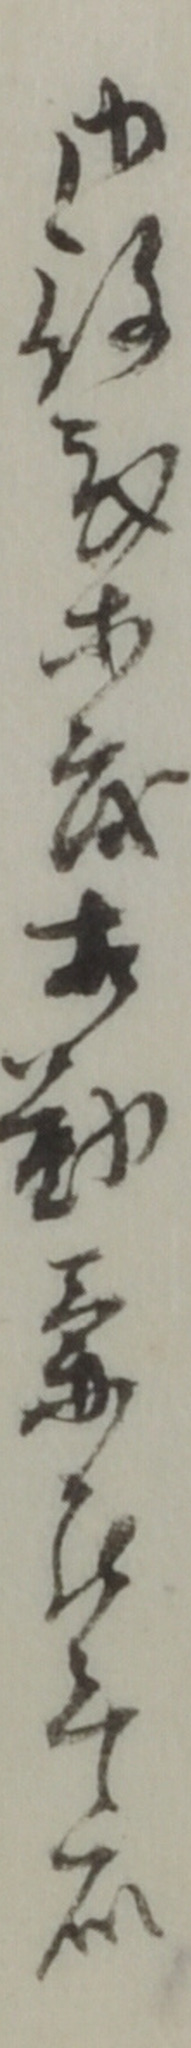御役義等茂相勤罷在候所
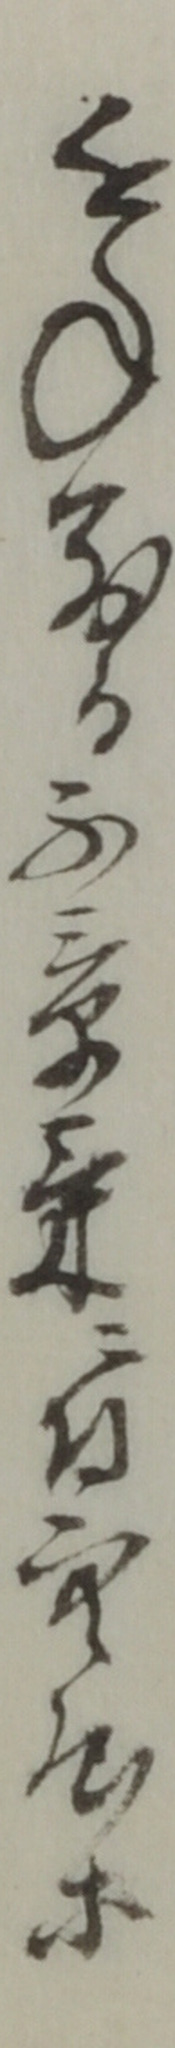近年別而不景気ニ付空屋等
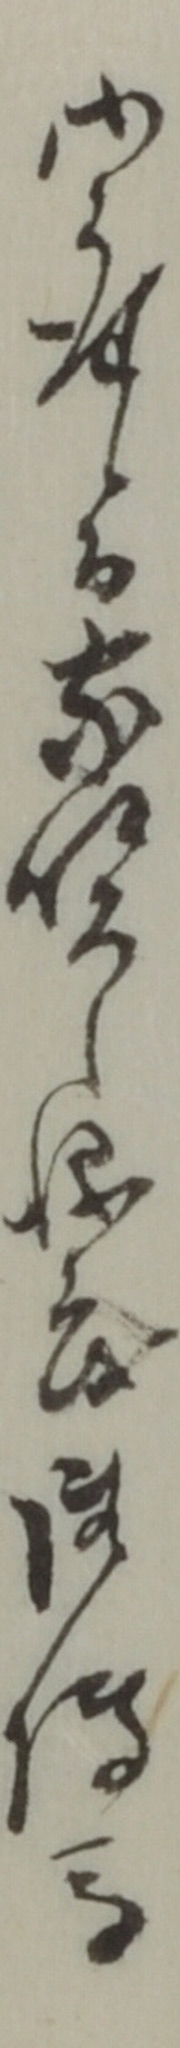御座候而家賃之儀茂御伝馬
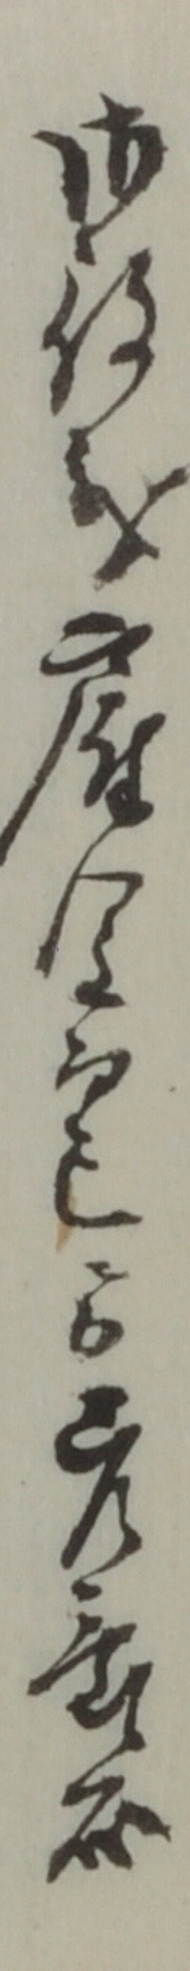御役義雇金而已ニ而差置候所
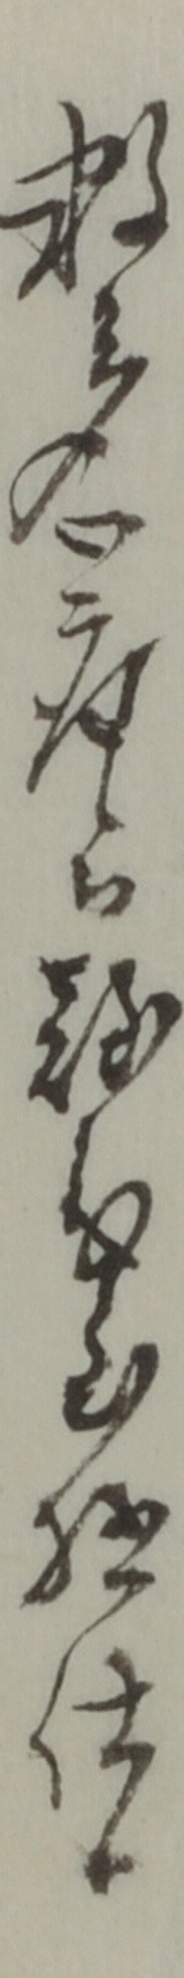数多御座候而難義至極仕候
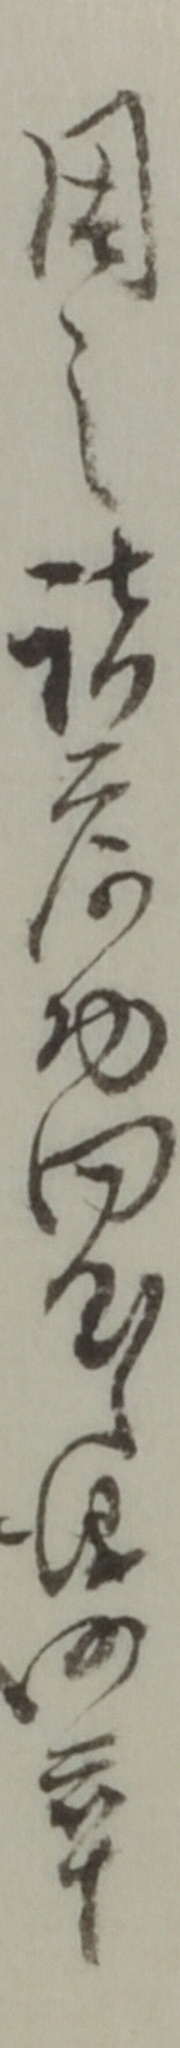因之諸荷物問屋候儀何卒
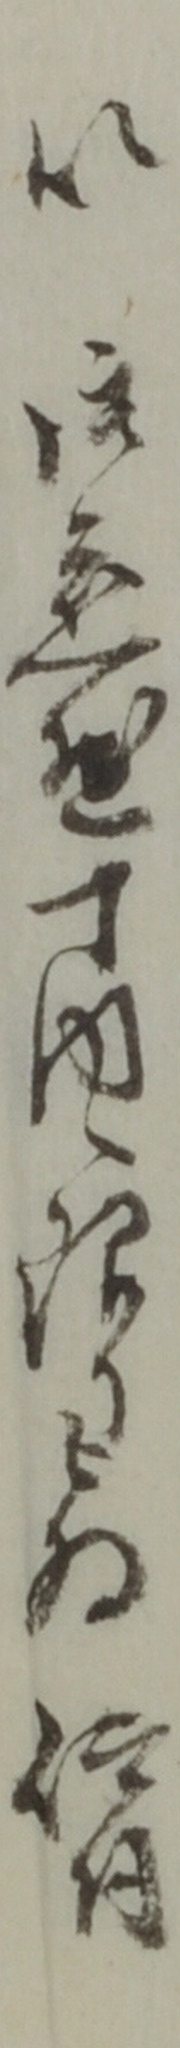以御慈悲丁内へ限り被為仰付
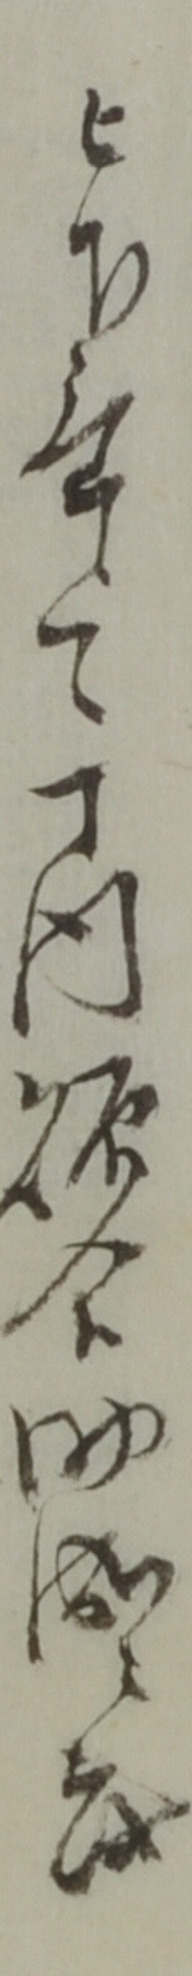被下置候ハヽ丁内賑合助成ニ茂
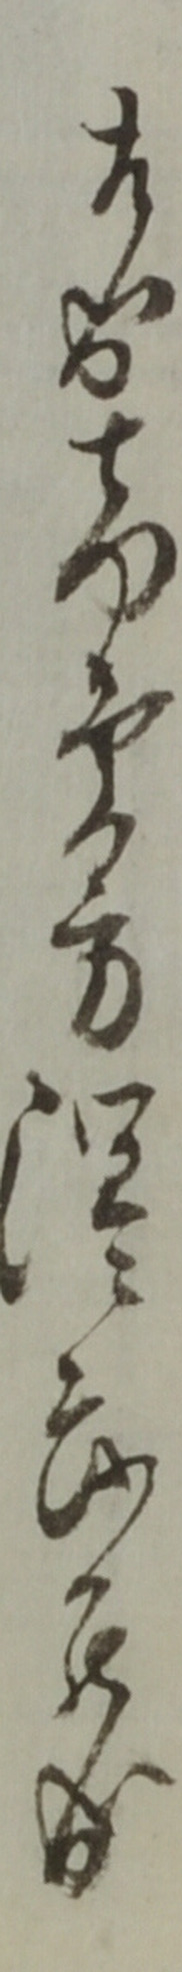相成商売方潤ニ茂罷成
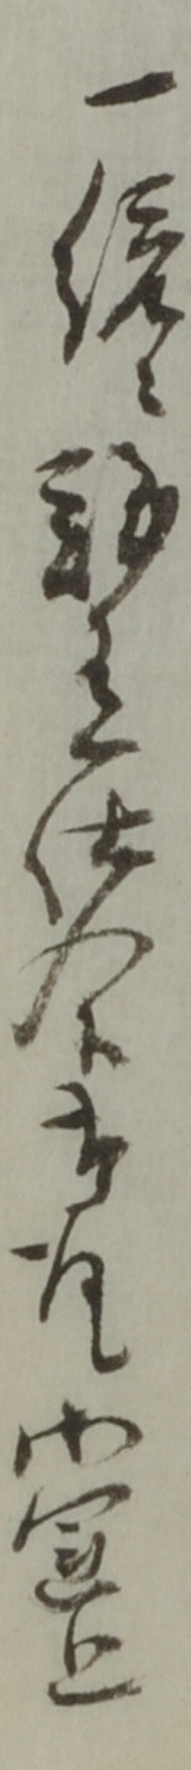一統ニ難有仕合奉存候御運上
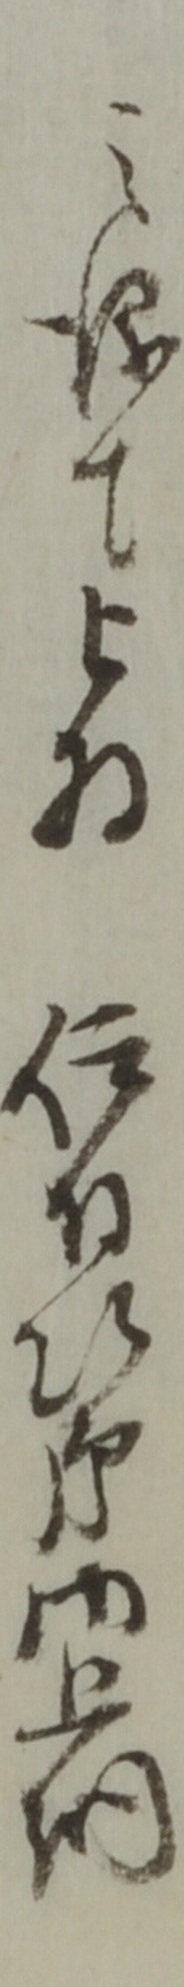之儀者被為仰付次第御上納
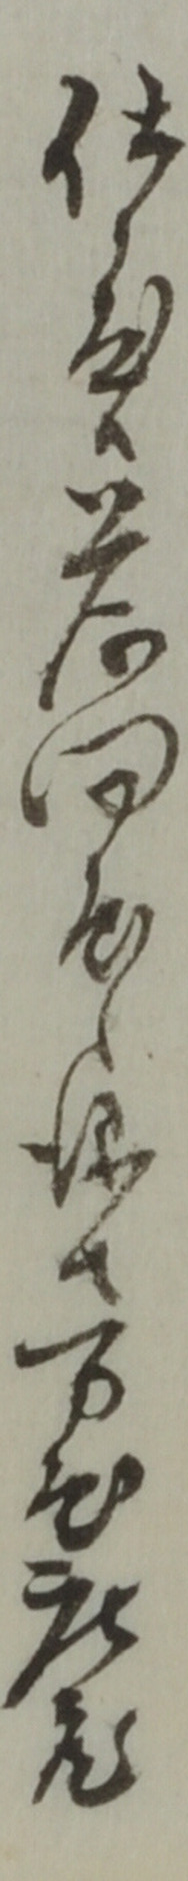仕度候荷問屋候儀者万屋庄屋
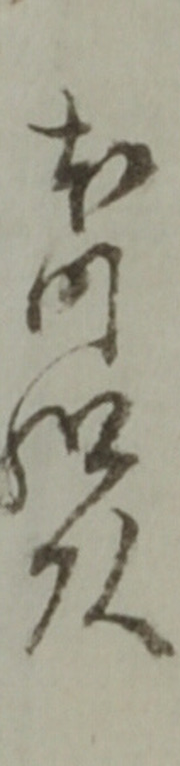本町組頭
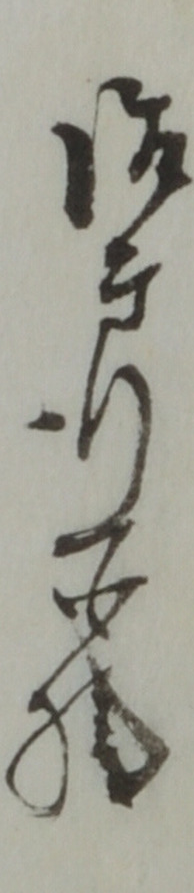御奉行所様
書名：申渡書（写）
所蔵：伊那市立高遠町図書館・合同会社AMANE
